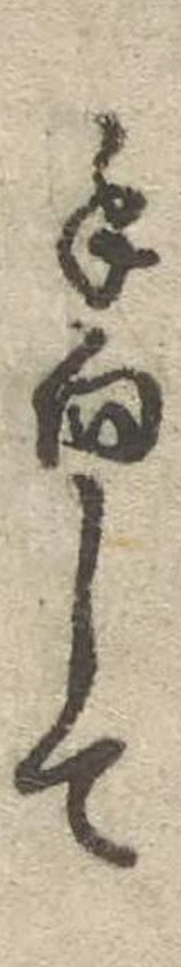手向して
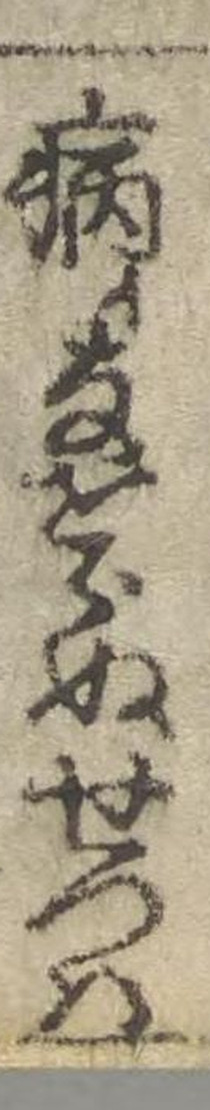病イなをらぬせつは
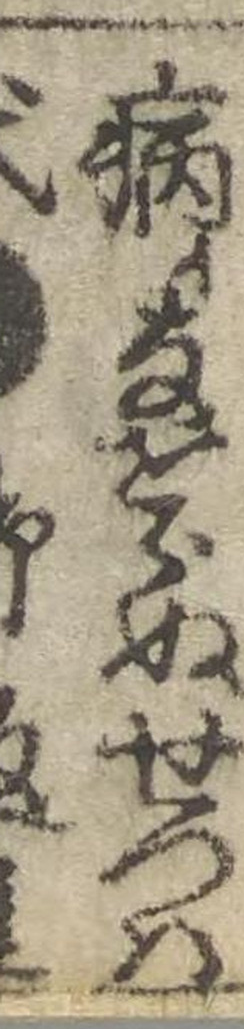病イなをらぬせつは
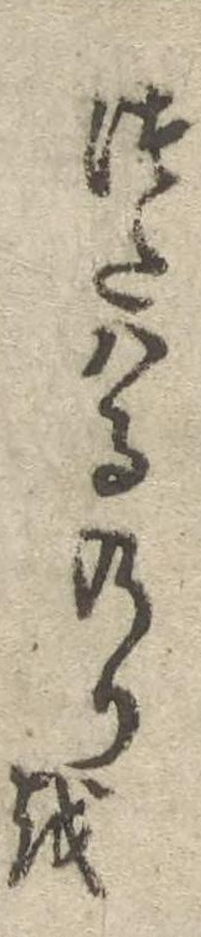つたはるのりを
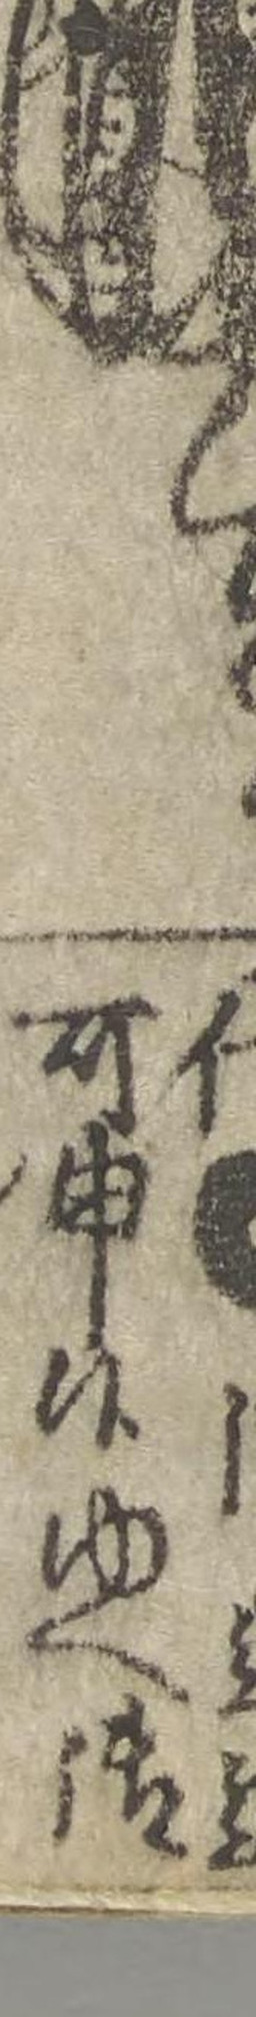可申候ゆへ御
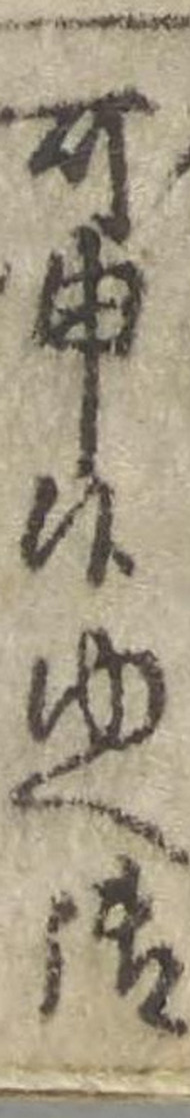可申候ゆへ御
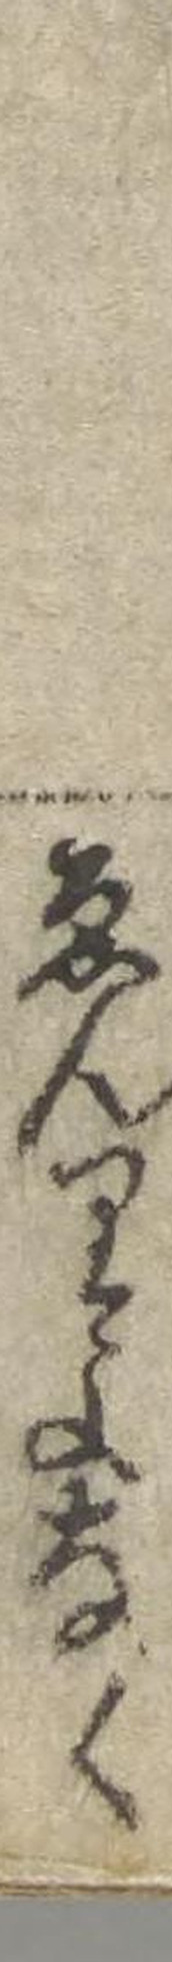ゑんりよなく
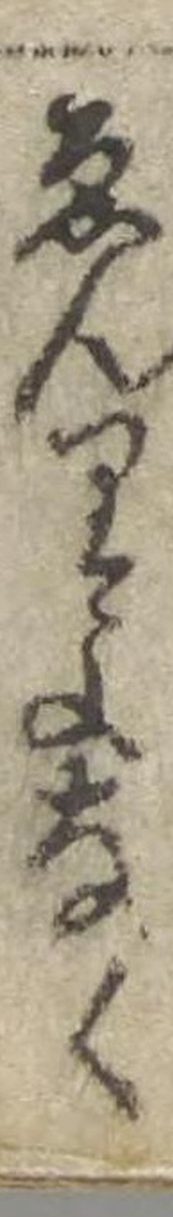ゑんりよなく
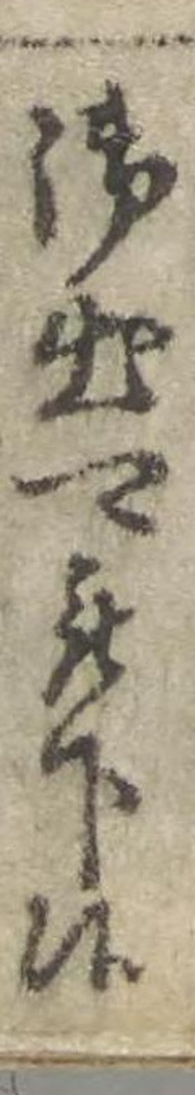御出可被下候

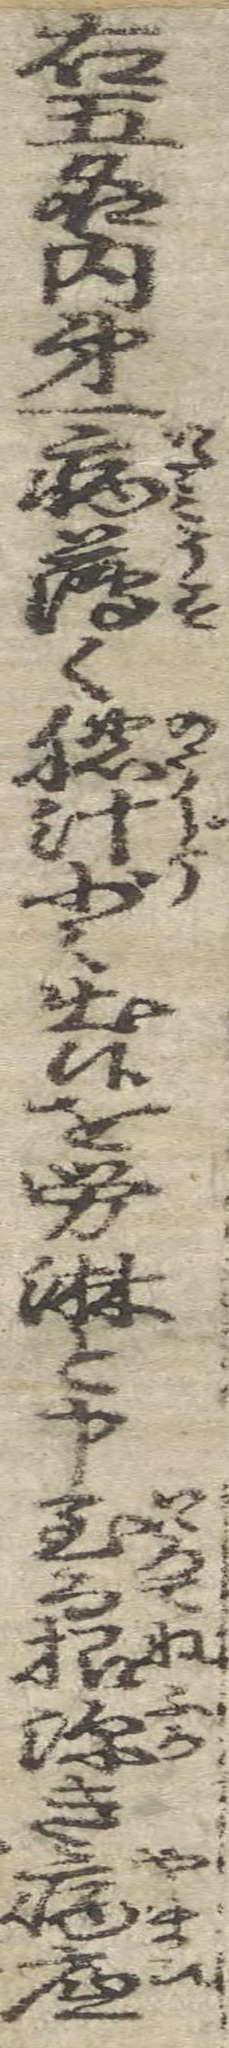右五名内第一病薄く膿汁少々出候を労淋と申至而根深き病底
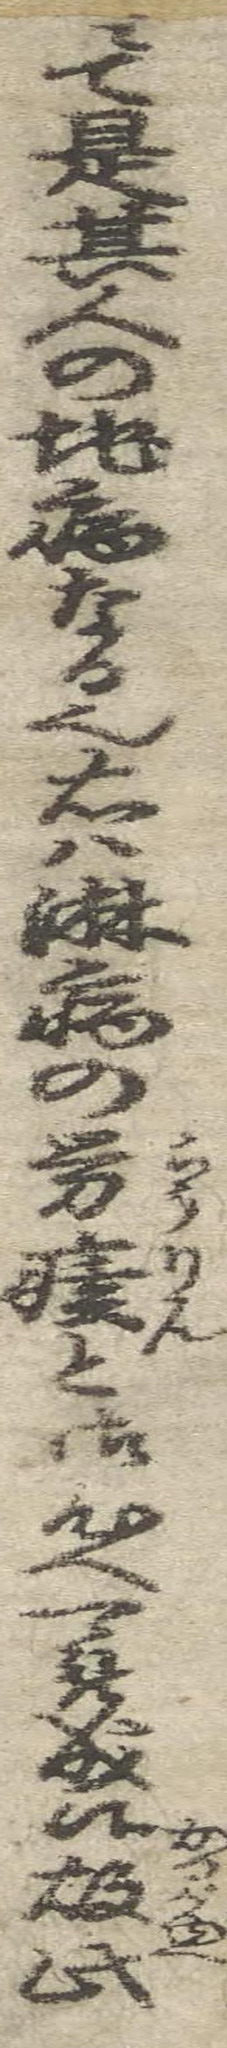にて是其人の地病なる也右は淋病の労淋と御心へ可被成候故此
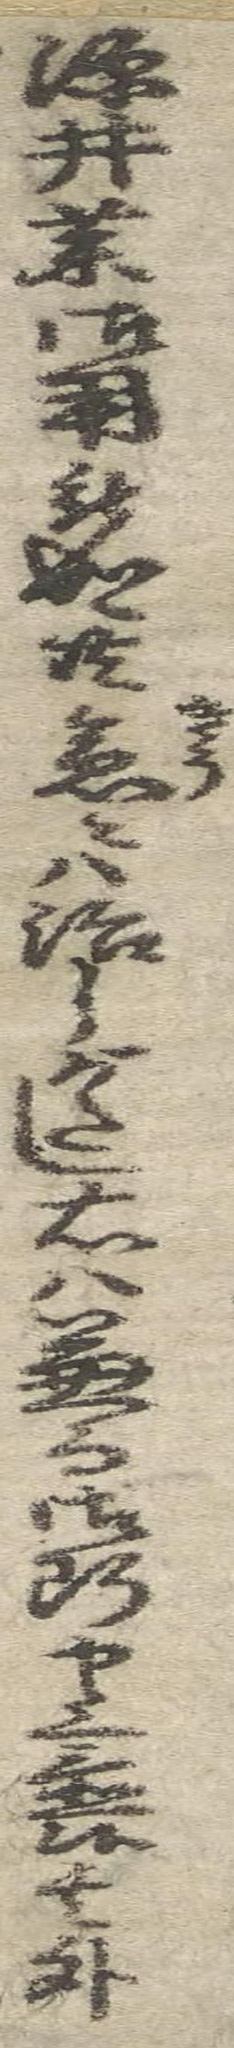深井薬御用被成候共急には治しがたし右は兼而御断申上置候其外
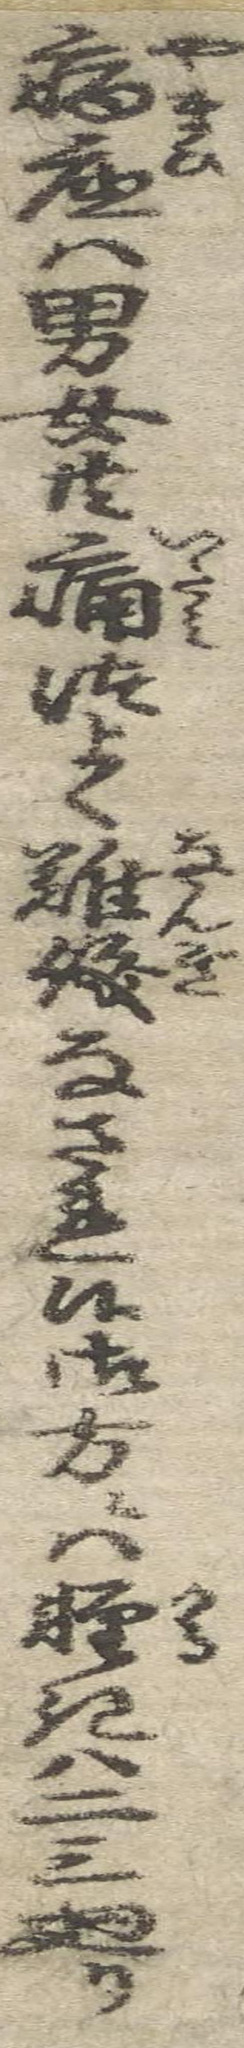病底は男女共痛つよく難儀なされ候御方には軽きはニ三廻り
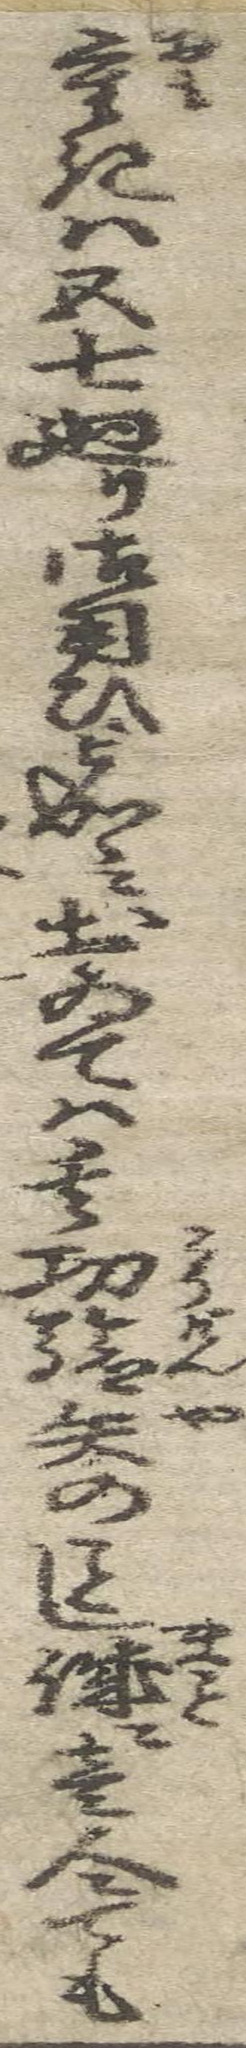重きは五七廻り御用ひ被成候ニおゐては其功験矢のことし誠に壱人にても
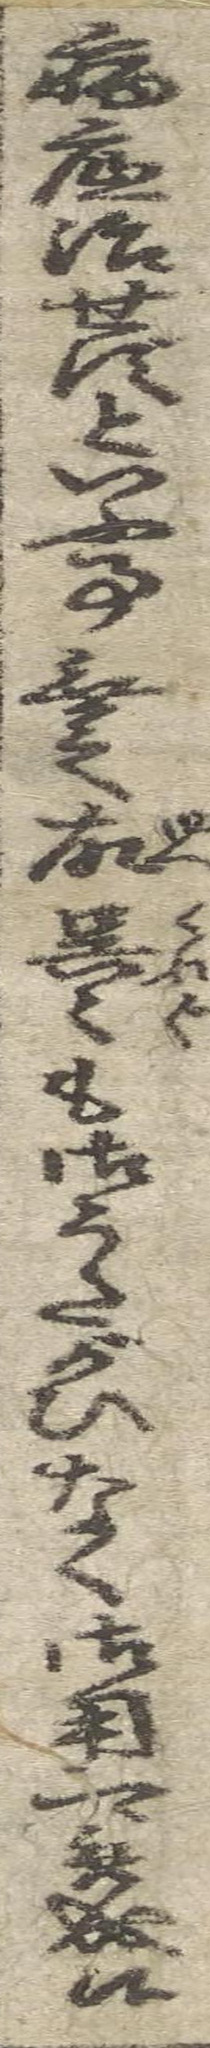病底治せずといふ事無之故呉々も御うたがひなく御用可被成候
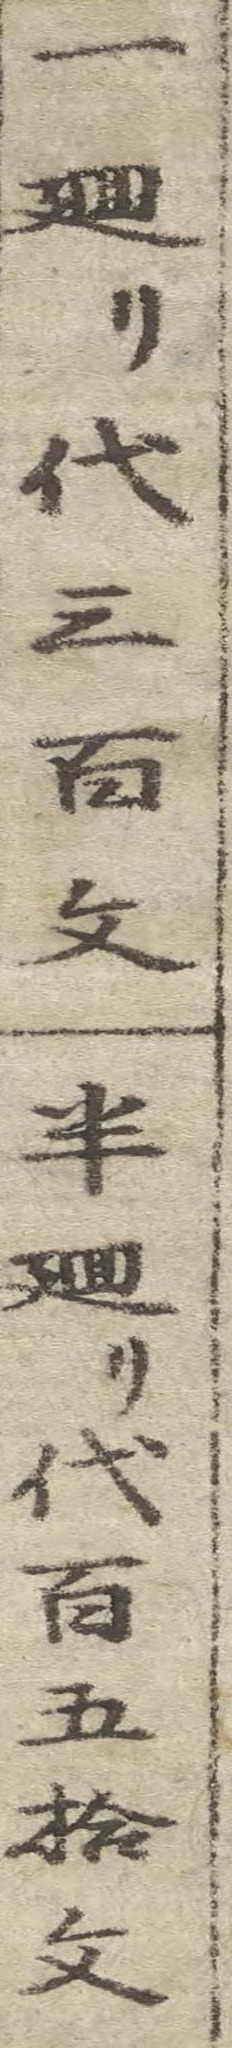一廻り代三百文半廻り代百五拾文
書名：浪華薬種問屋能書張交帖. 二
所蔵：国立国会図書館 National Diet Library, JAPAN
